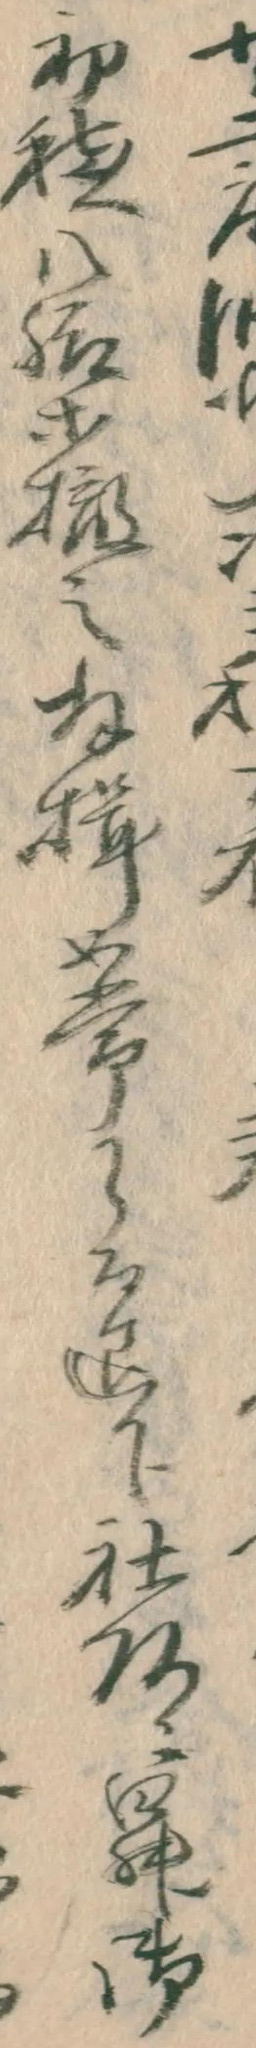初穂八脚等撤拝揖如常了而退下社頭ニ昇御
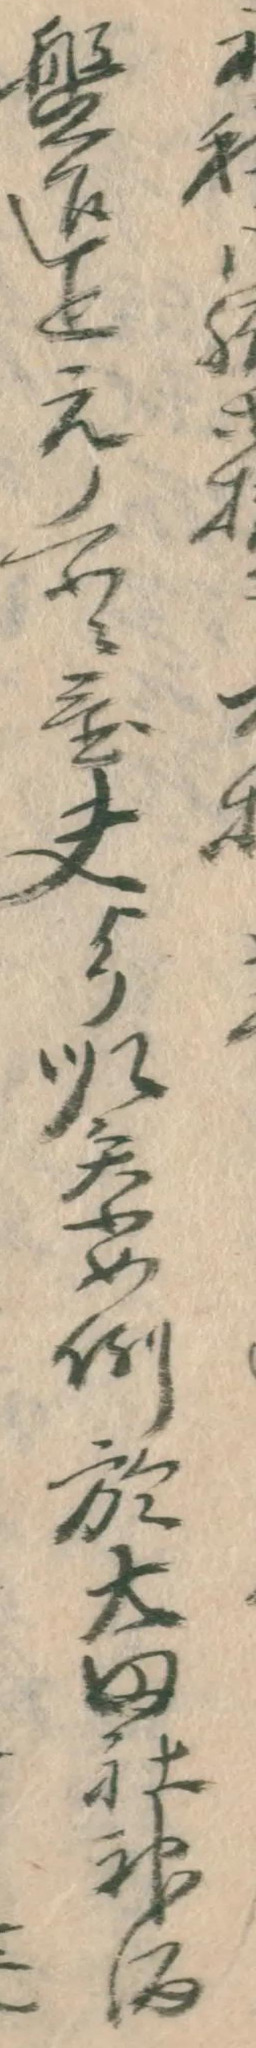盤返上元ノ所二置夫より順参如例於大田社神酒
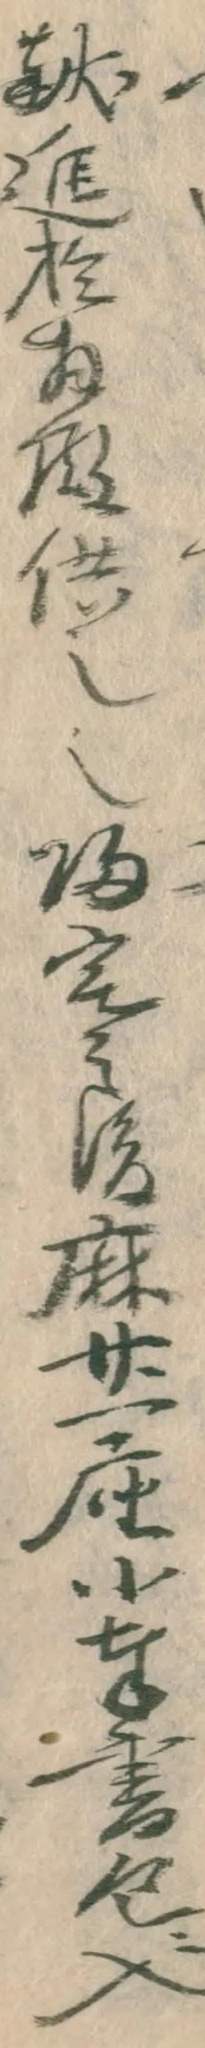献進於拝殿供之也帰宅之後麻廿一座小奉書包ニ入
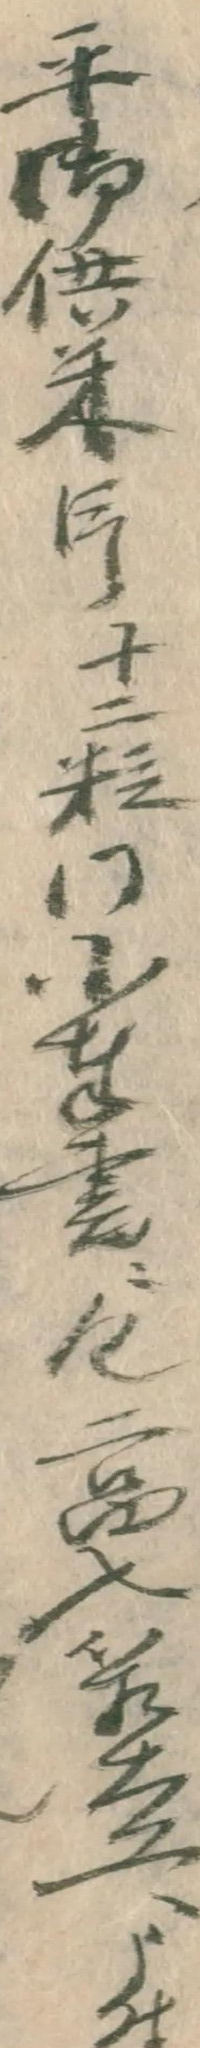平御供米片十二粒同小奉書に包二品入箱大工へ申付
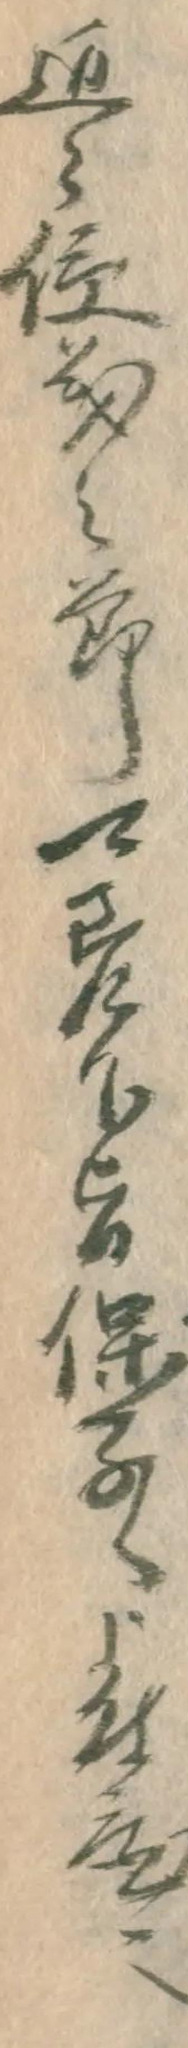近々便義之節可差下旨保子へ申付置也

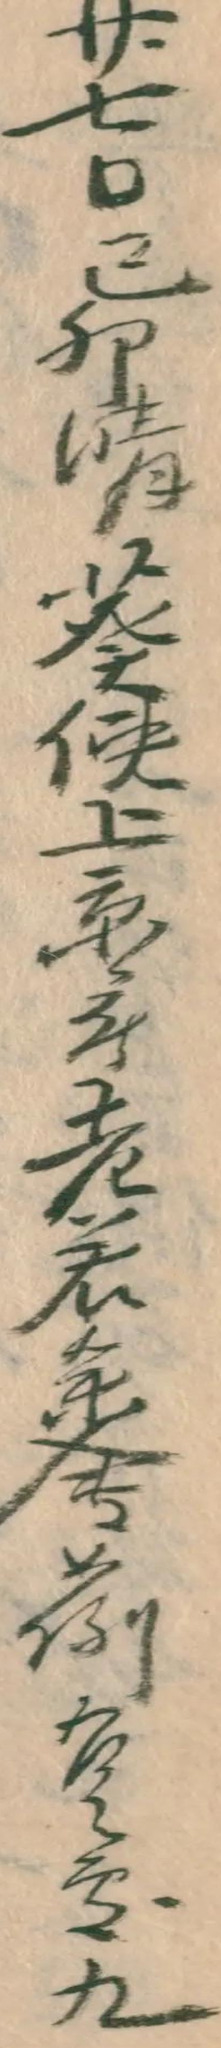廿七日己卯晴葵使上京ニ付老若参會如例有之處九
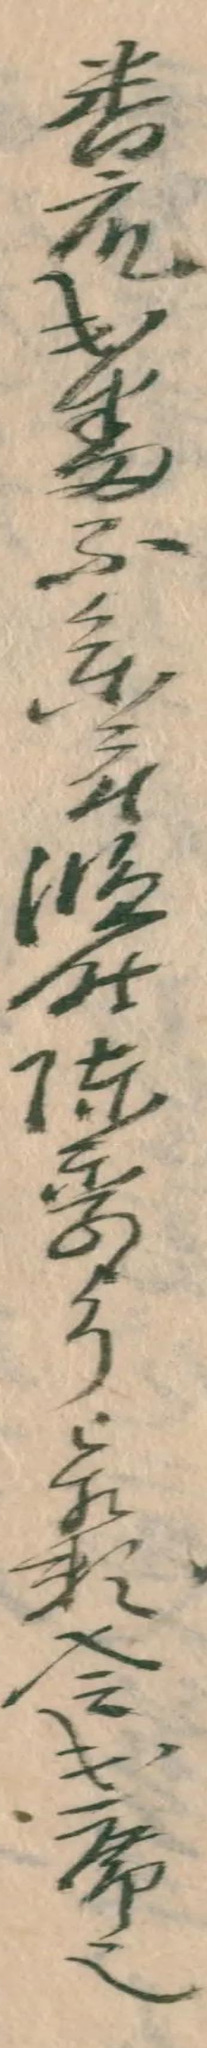番衆出番不参ニ付臨時陳季より被相頼令出席也
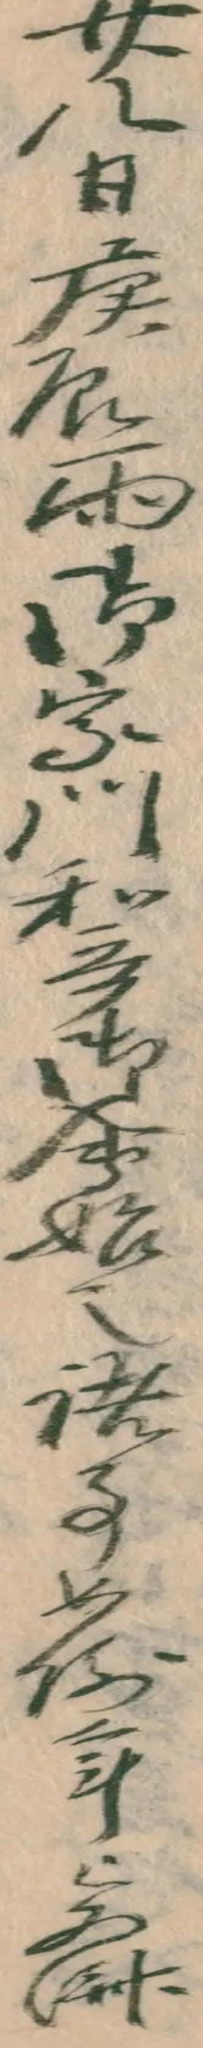廿八日庚辰雨御家門和歌御會始也諸事如例年被為済
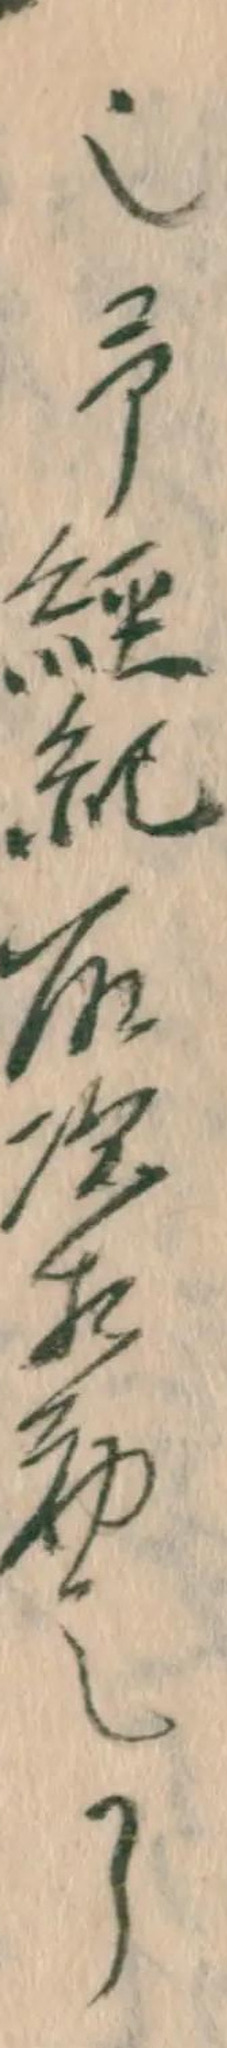也予経紀取次相勤之了
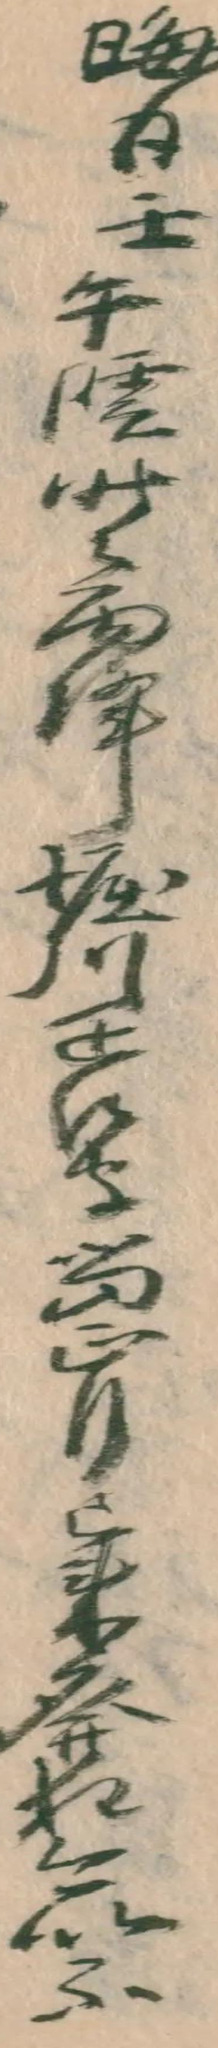晦日壬午曇時々雨降堀川近江守當正月已来発狂今般不
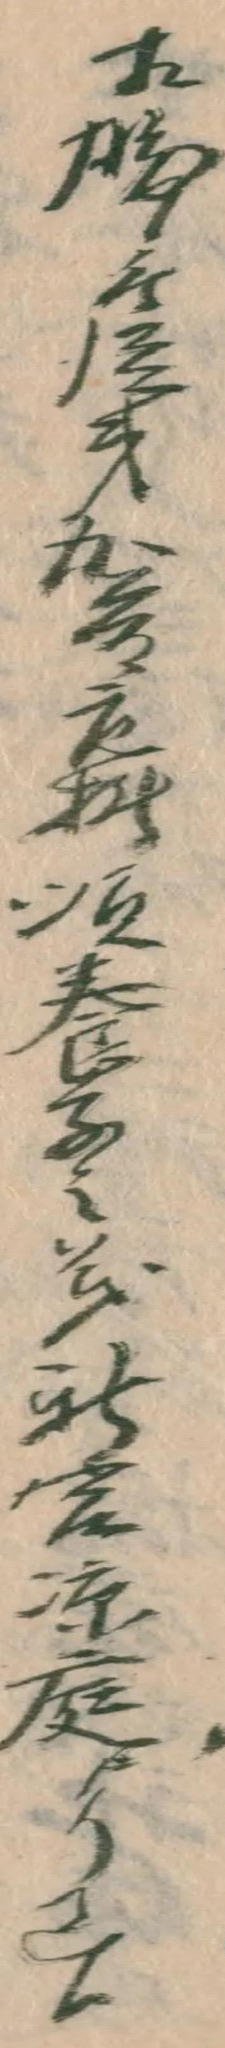相勝ニ付従弟加藤順養子之義新宮涼庭より進候
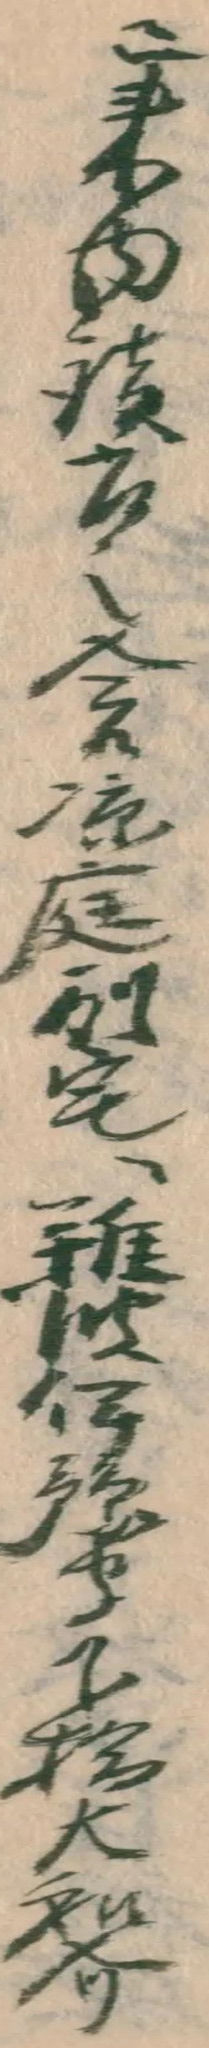已来内談有之今日涼庭別宅へ難波伊豫守下橋大和介
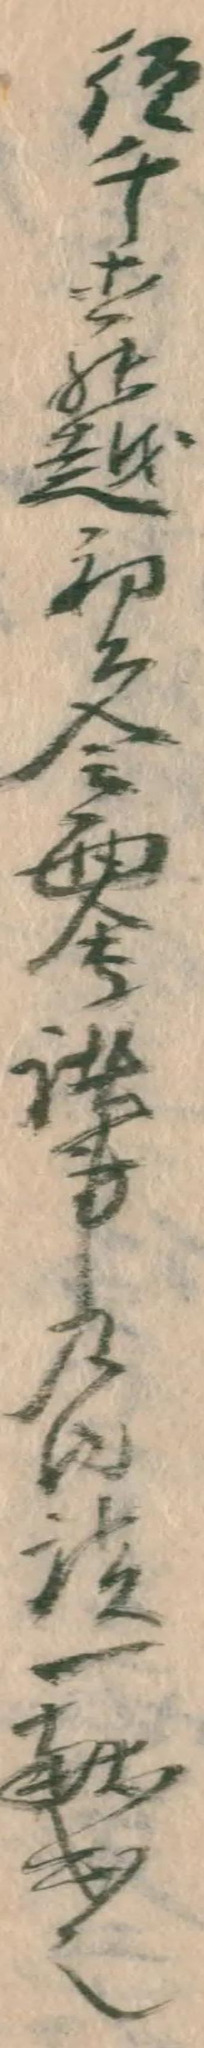経千直罷越初而令面會諸事及内談一献出也
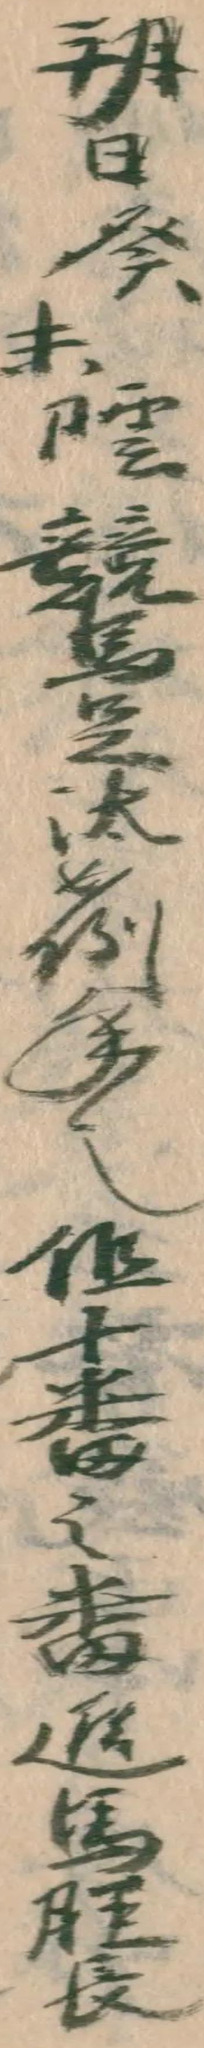朔日癸未曇競馬足汰如例年也但十番之番追馬脛長
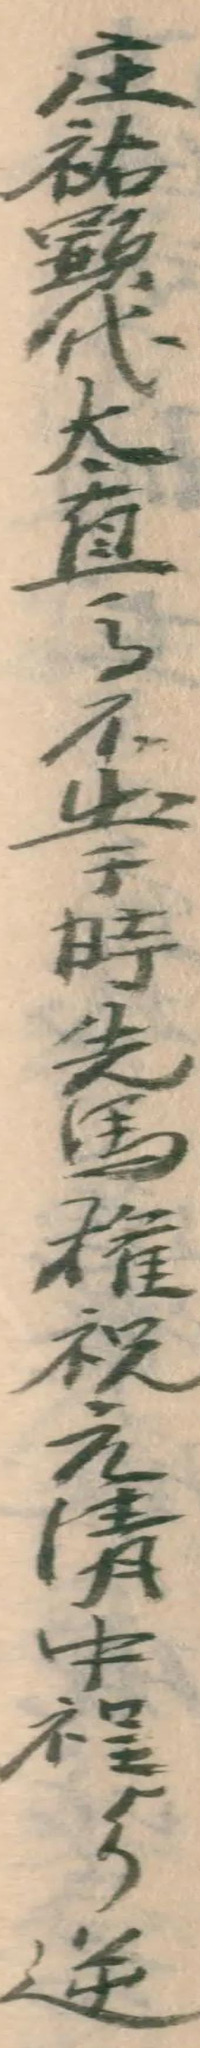庄祐顕代太直馬不出于時先馬権祝元清中程より逆
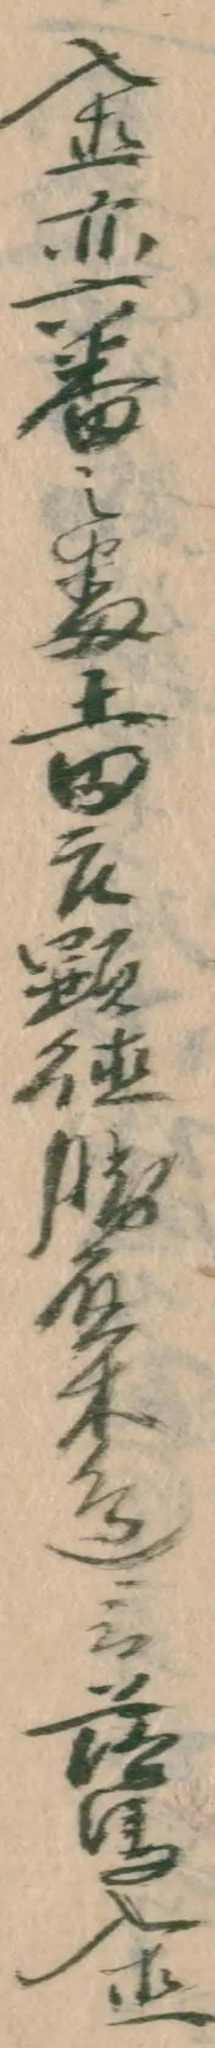入直亦六番之番土田庄顕徳勝負木邊ニ而落馬入直
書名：賀茂社記録. 第67冊
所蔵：国立国会図書館 National Diet Library, JAPAN
